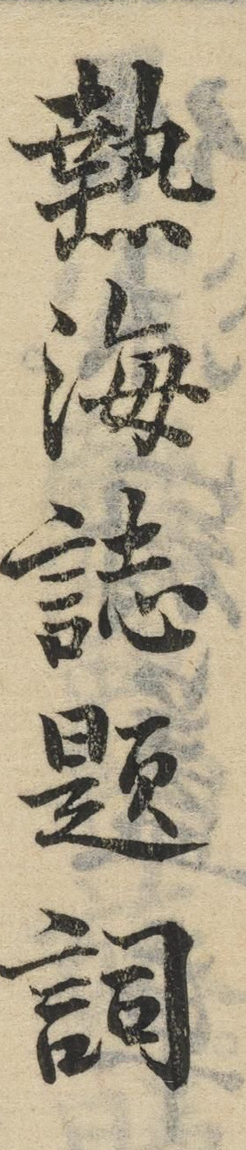熱海誌題詞
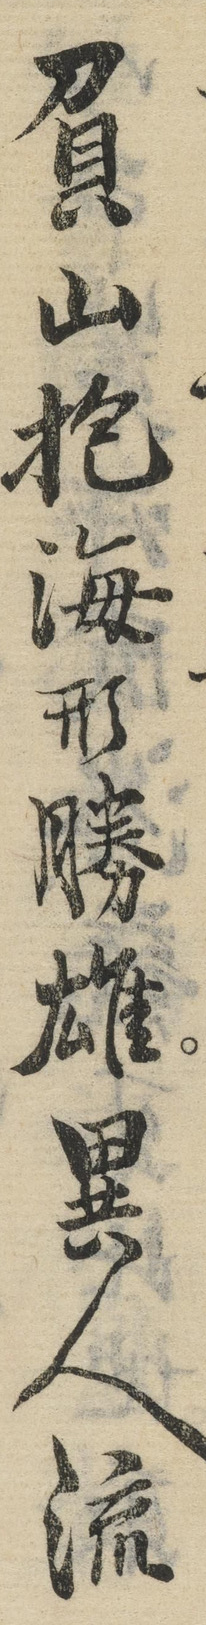負山抱海形勝雄。異人流
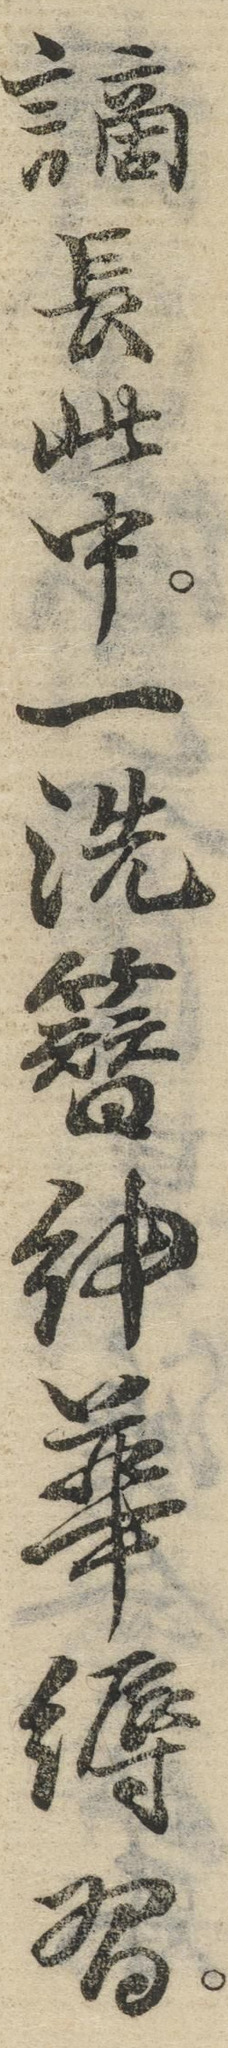謫長此中。一洗簪神華褥習。
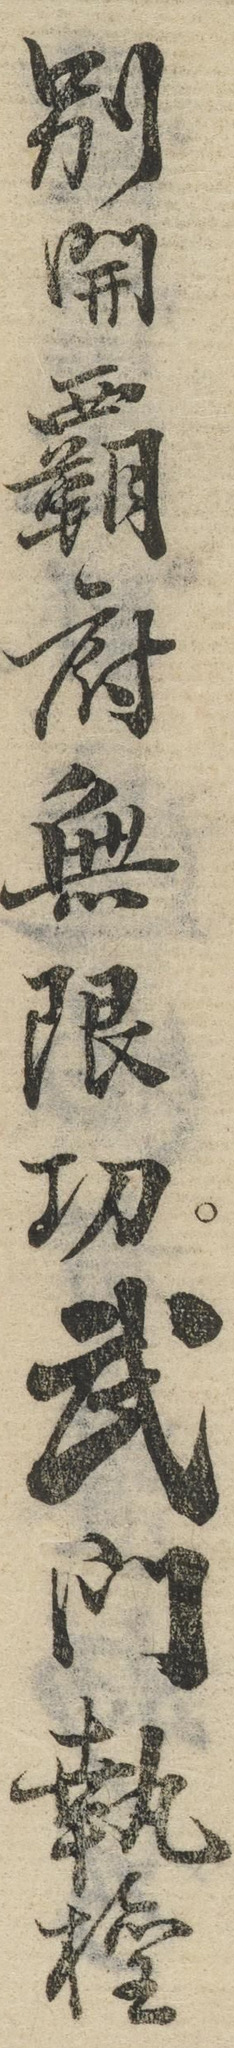別開覇附無限功。武門執権
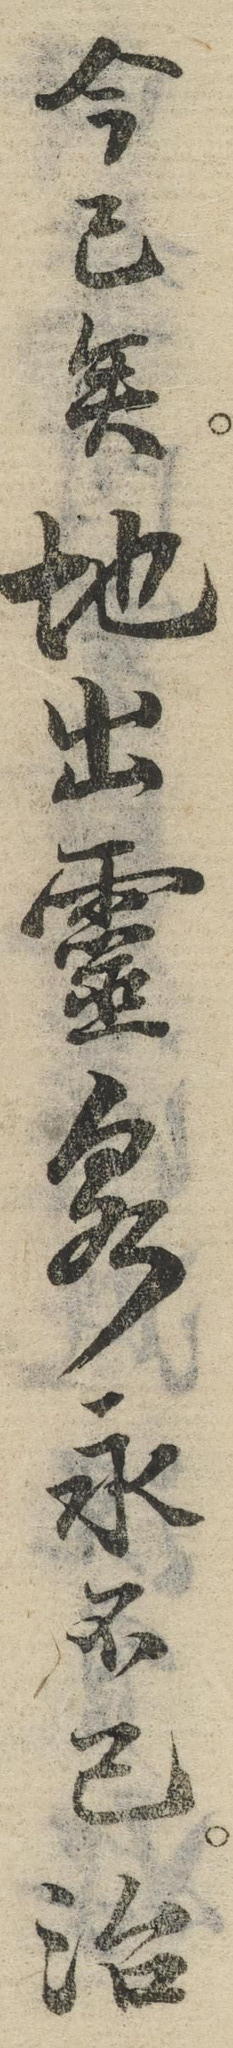今己矣。地出霊泉永名己。治

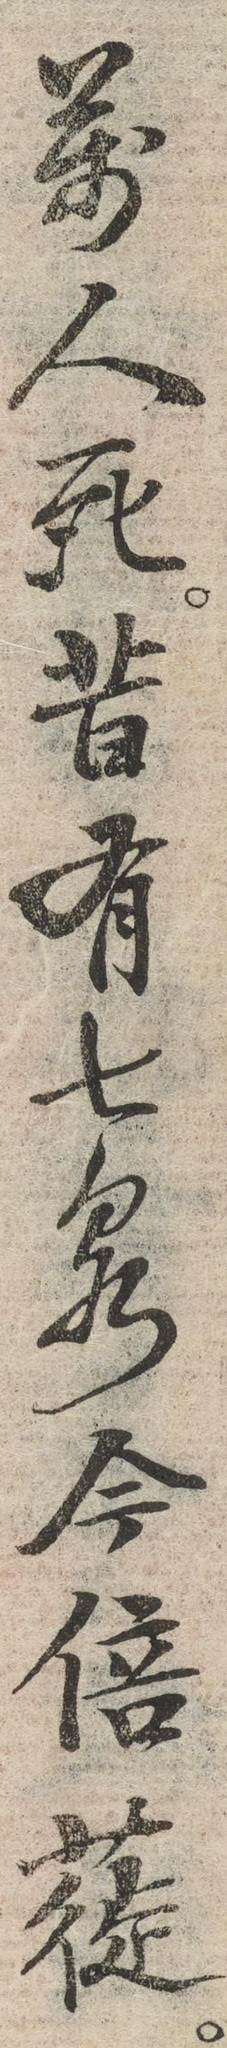万人死昔有七泉今倍蓰
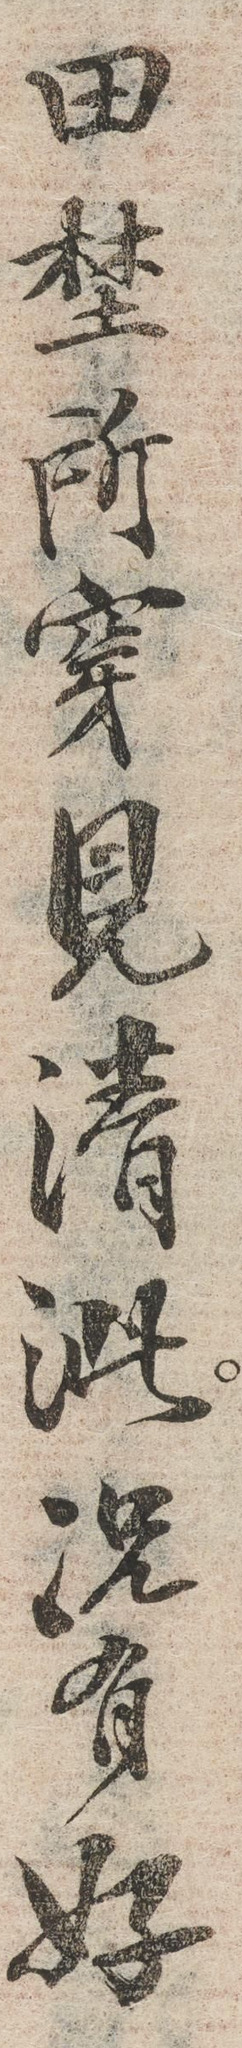田埜所穿見清洲況有好
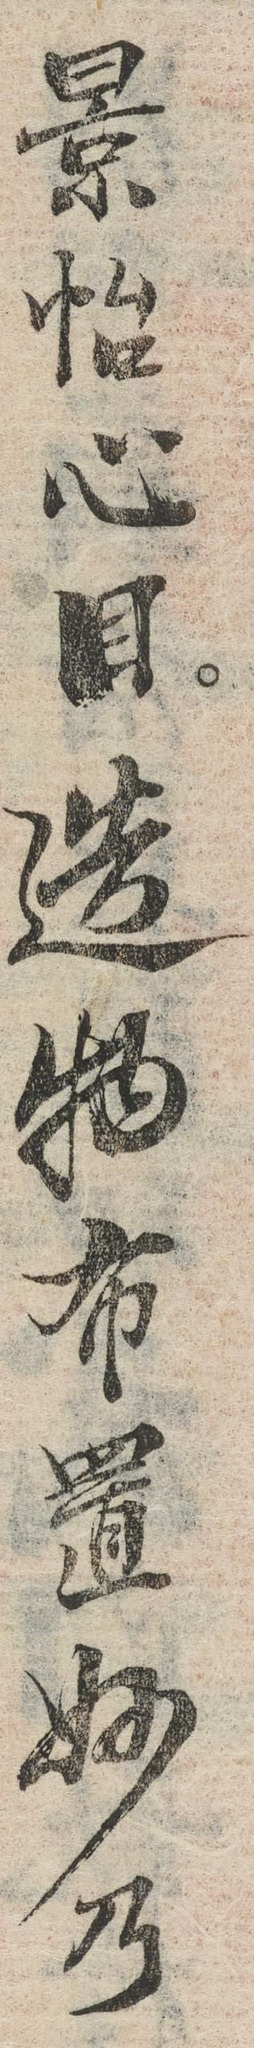景怡心目造物布置妙乃
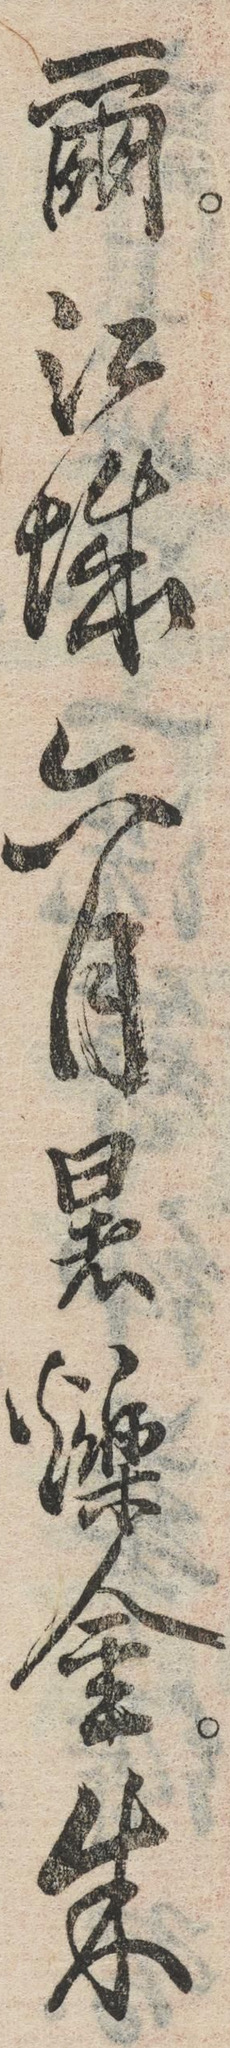爾江城六月暑爍金朱
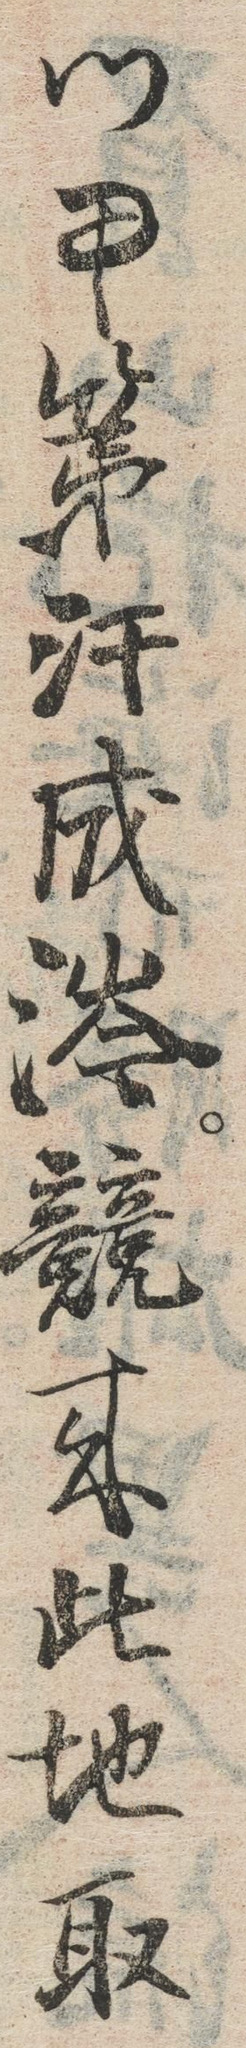川甲第汗成涔競来此地取
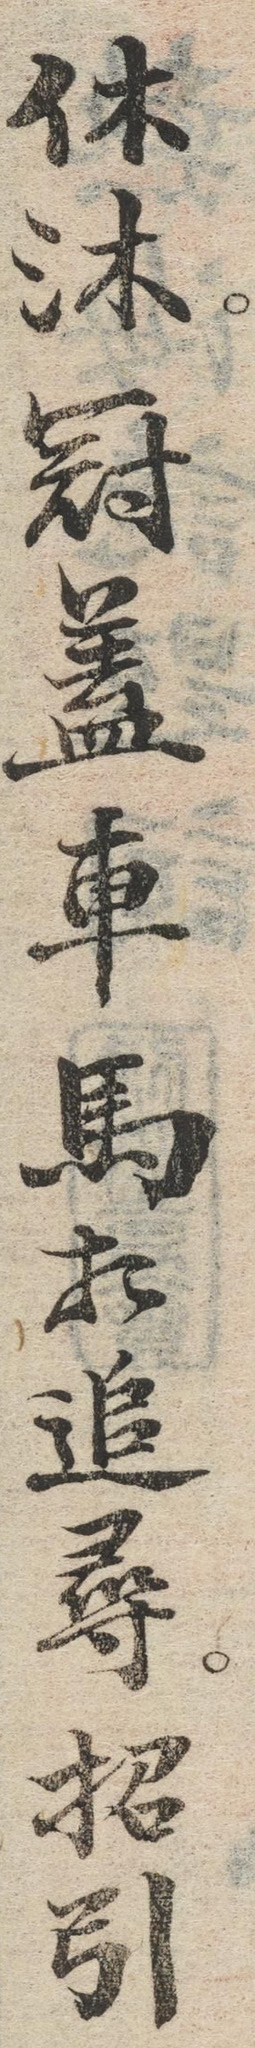休沐冠蓋車馬相尋招引
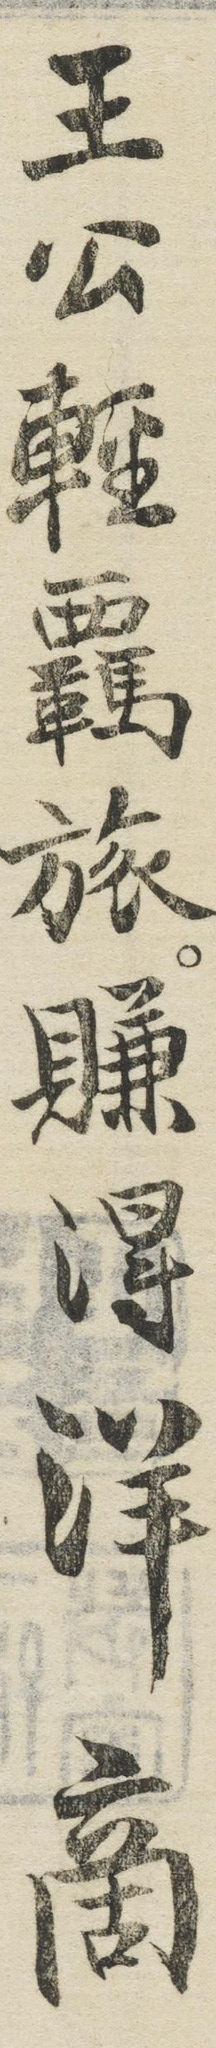王公軽覊旅賺得洋啇
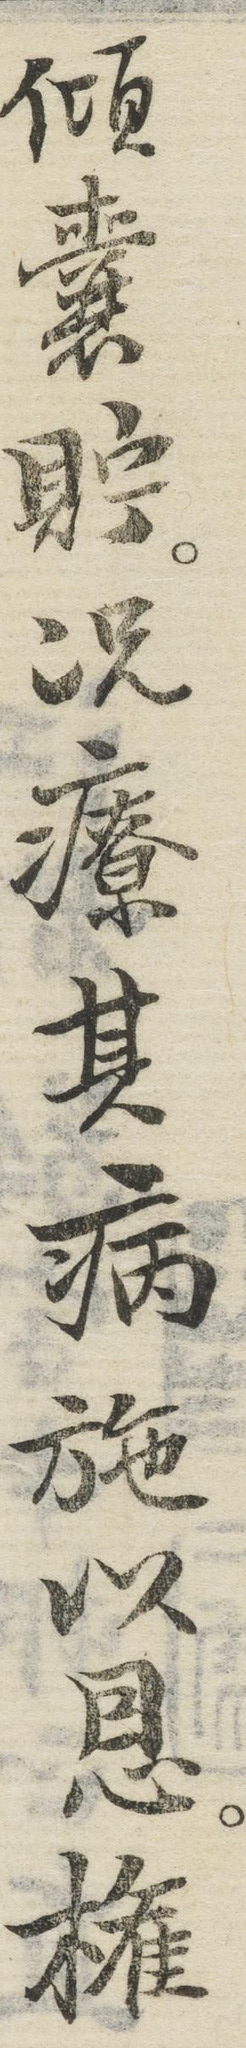傾衰貯況療其病施以権
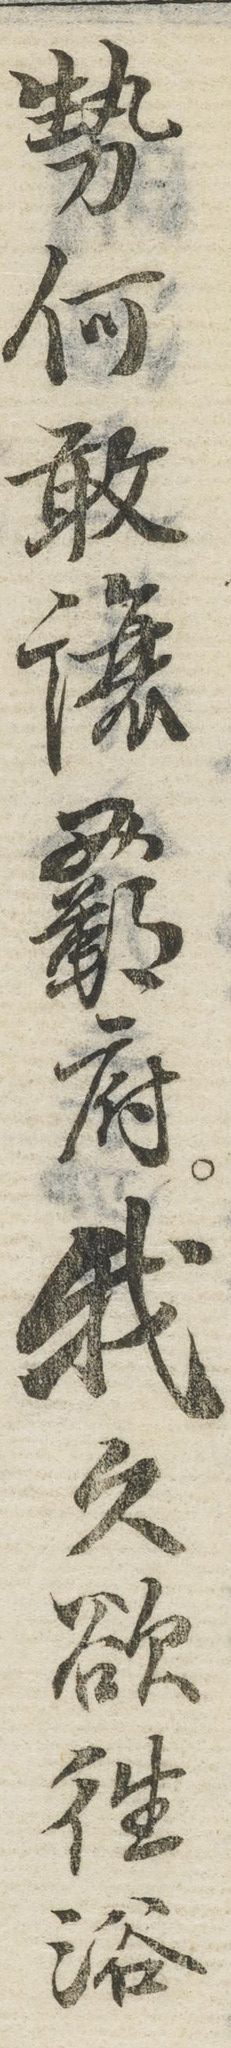勢何敢譲發府我久欲往浴
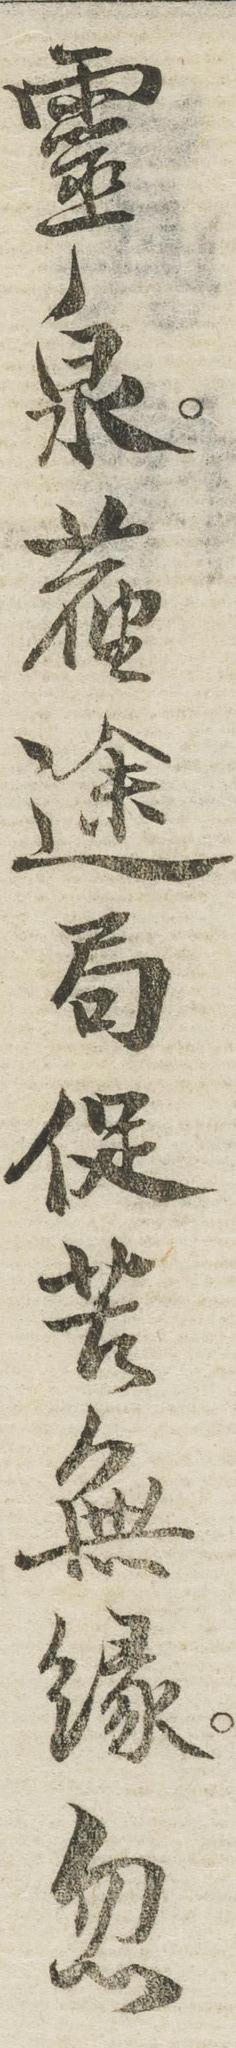霊泉途局促苦無縁忽
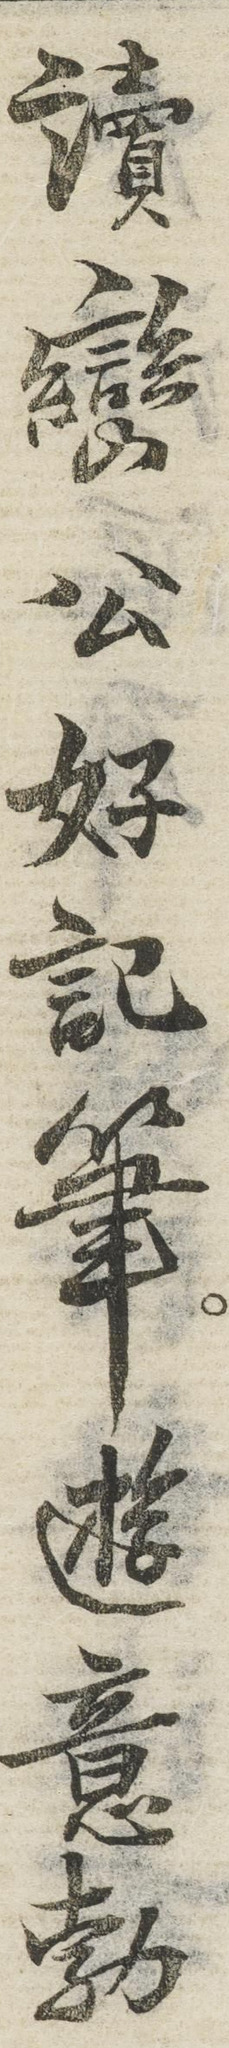読変公好記筆遊意勃
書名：豆州熱海誌　完
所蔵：東京大学地震研究所図書室 Earthquake Research Institute Library, The University of Tokyo, JAPAN
